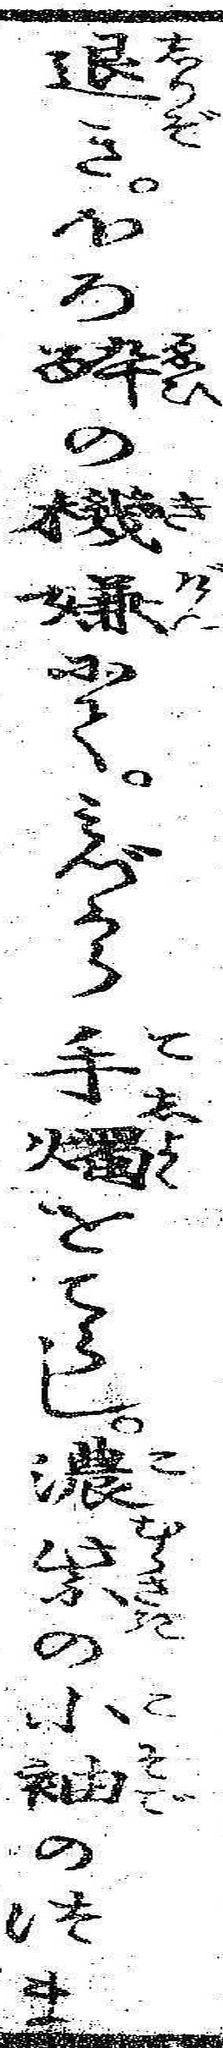退き。ほろ酔の機嫌にて。みづから手燭をてらし。濃紫の小袖のつま
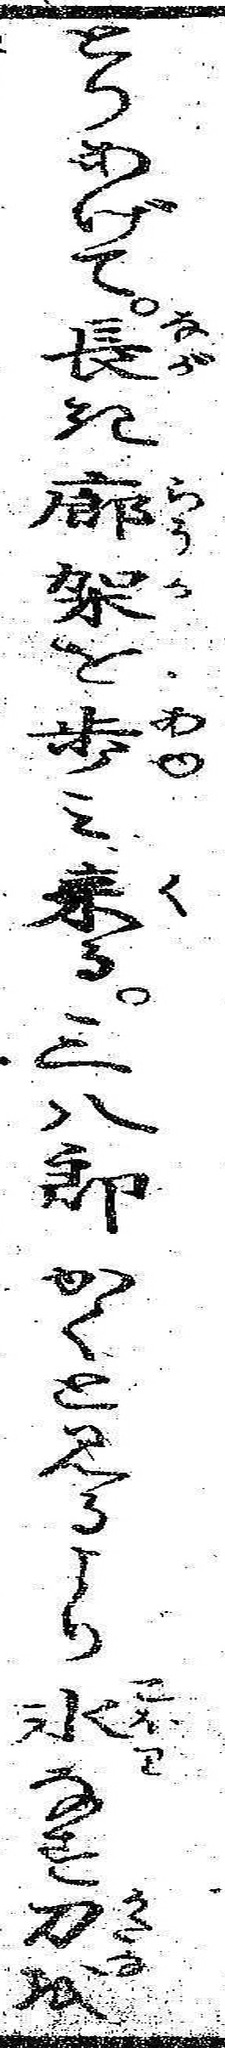とりあげて。長き廊架を歩み来る。三八郎かくと見るより氷なす刀を
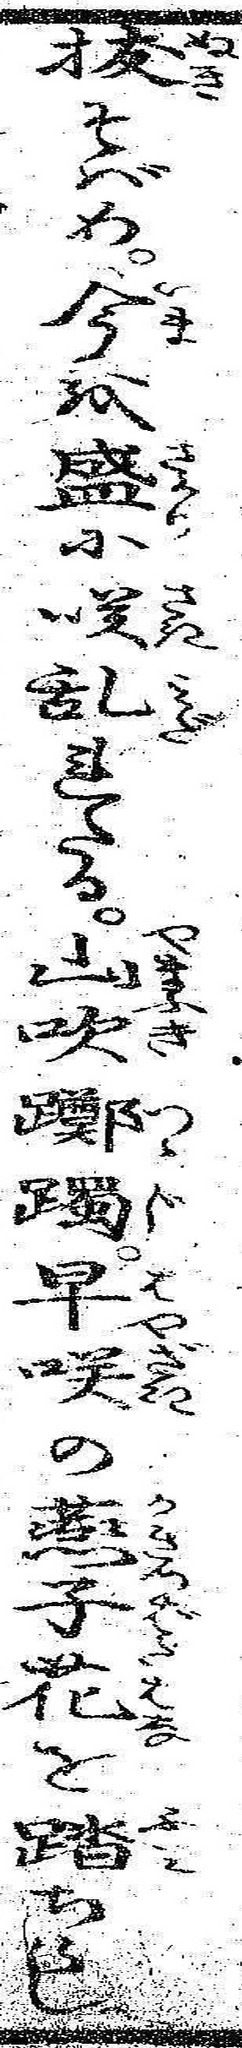抜そばめ。今を盛に咲乱れたる山吹躑躅。早咲の燕子花を踏ちらし
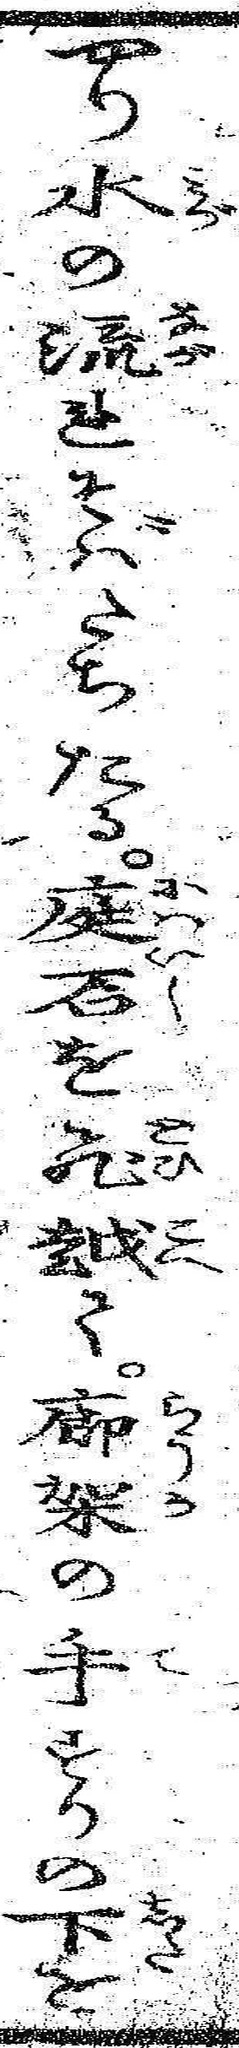やり水の流れそばたちたる。庭石を飛越て。廊架の手すりの下を

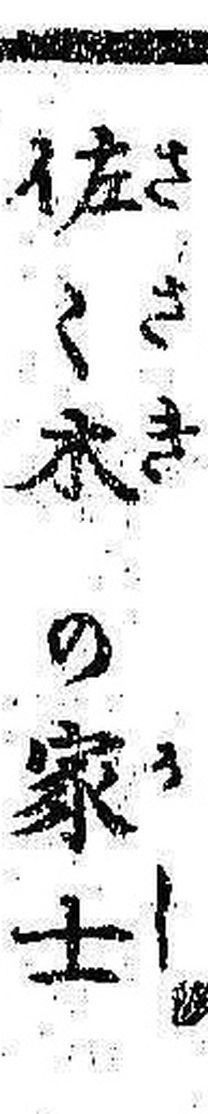佐々木の家士
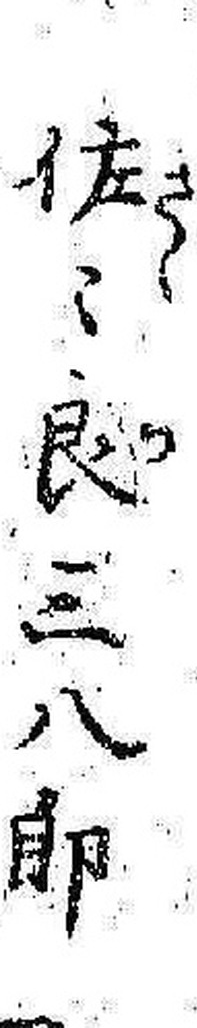佐々良三八郎
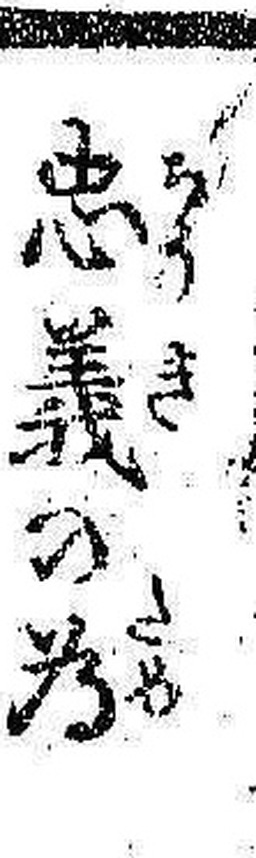忠義の為
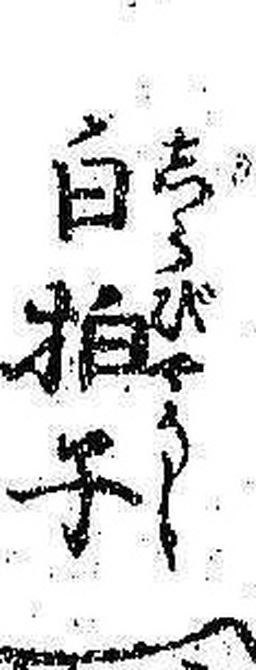白拍子
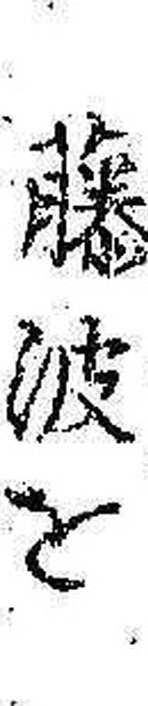藤波を
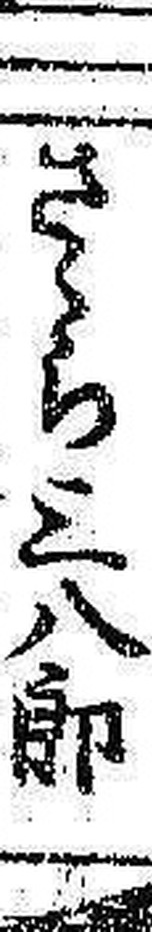さゝら三八郎

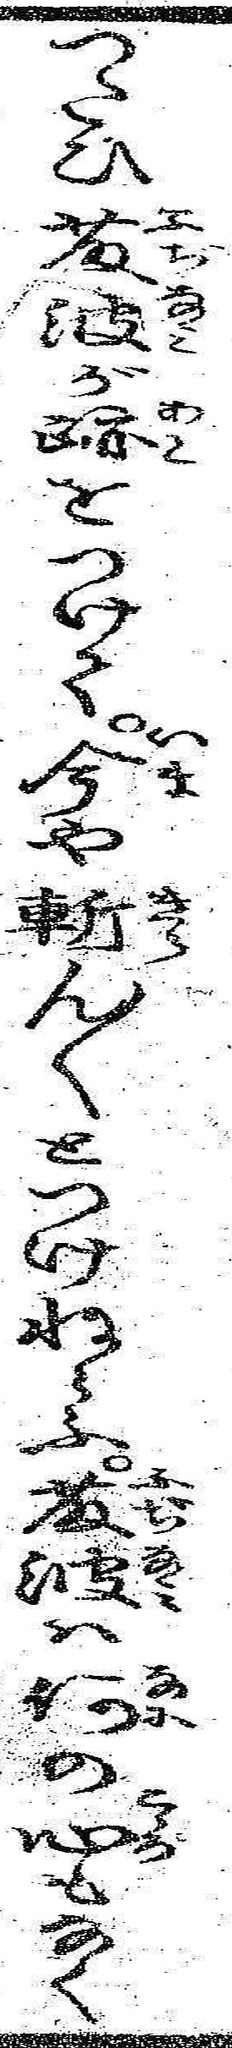つたひ藤波が跡をつけて。今や斬ん〳〵とつけねらふ。藤波は何の心もなく
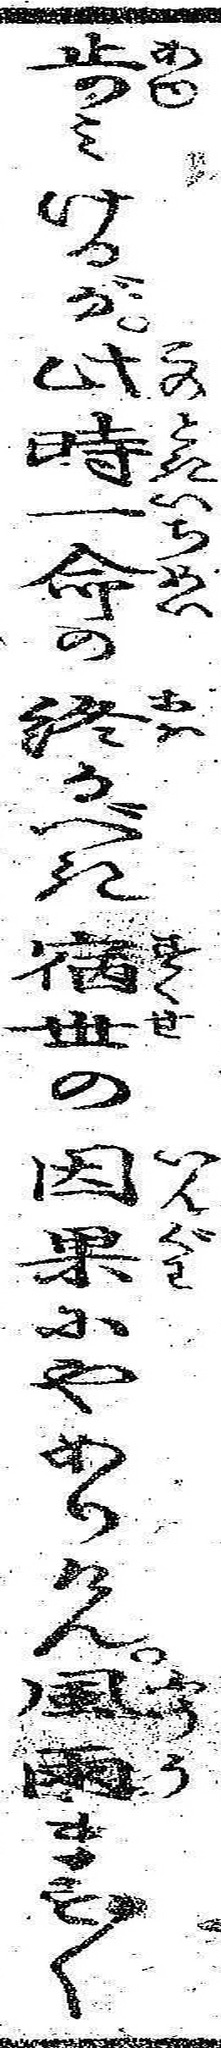歩みけるが。此時一命の終るべき宿世の因果にやありけん。風雨ます〳〵
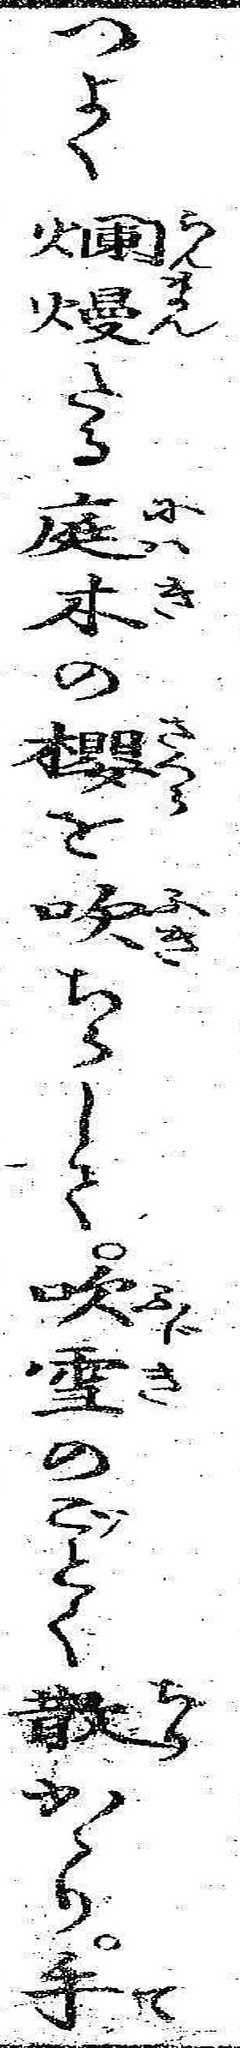つよく爛熳たる庭木の桜を吹ちらして。吹雪のごとく散かゝり。手
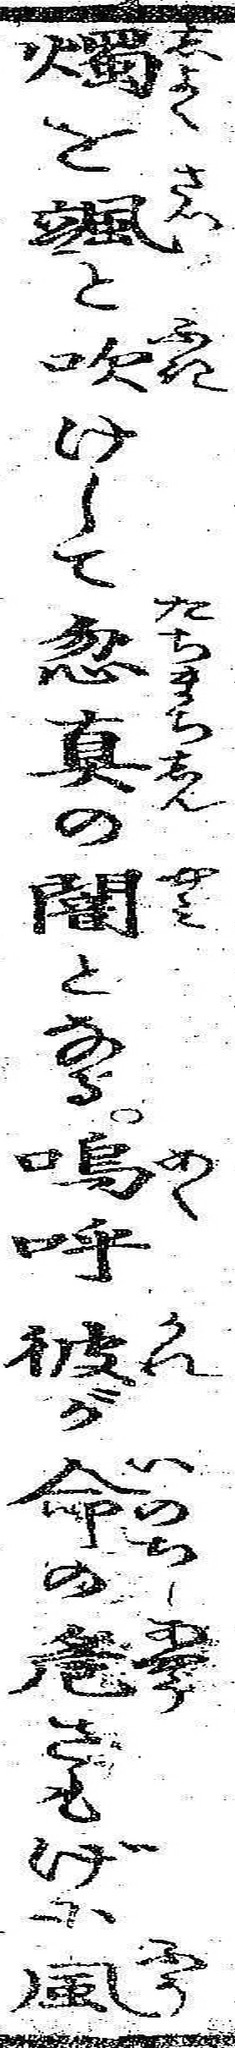燭を颯と吹けして忽真の闇となる。嗚呼彼が命の危さもげに風
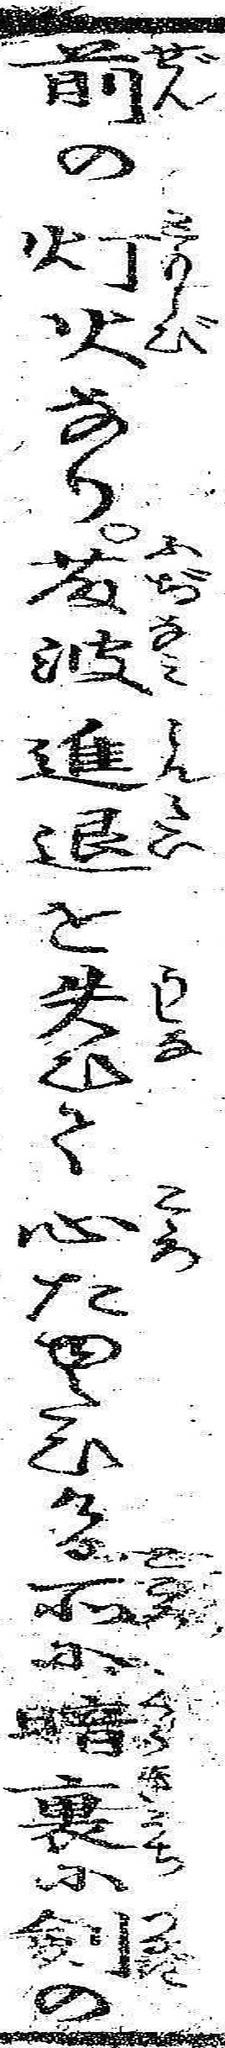前の灯火なり。藤波進退を失ひて心たゆたひける所に暗裏に剣の
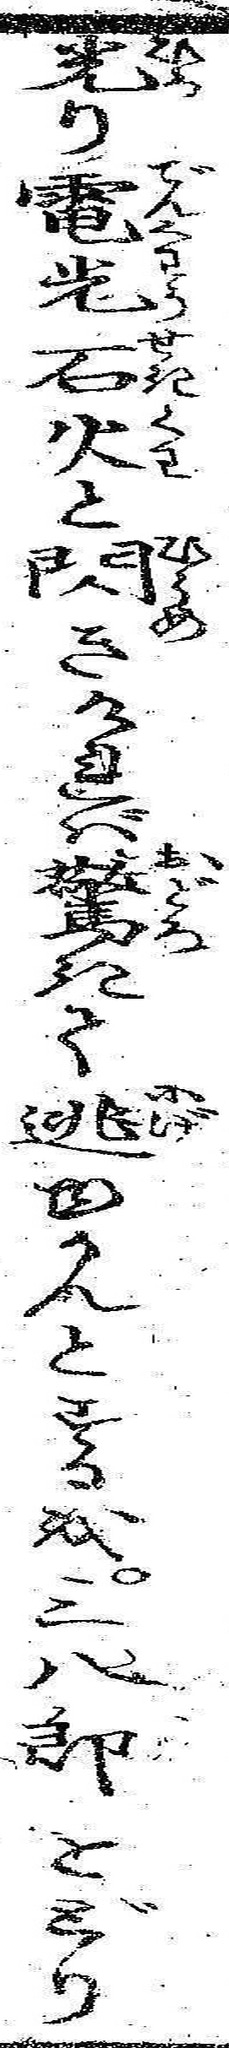光り電光石火と閃きければ驚きて逃ゆかんとするを。三八郎をどり
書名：昔話稲妻表紙
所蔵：国文学研究資料館
